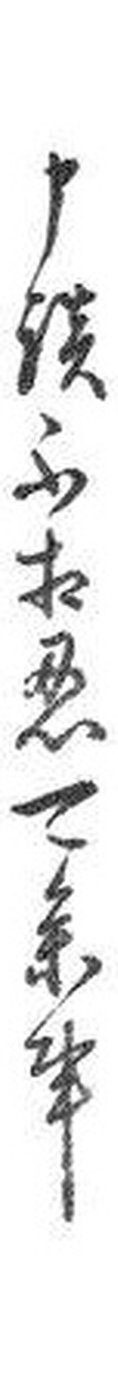申談不相忍可参事
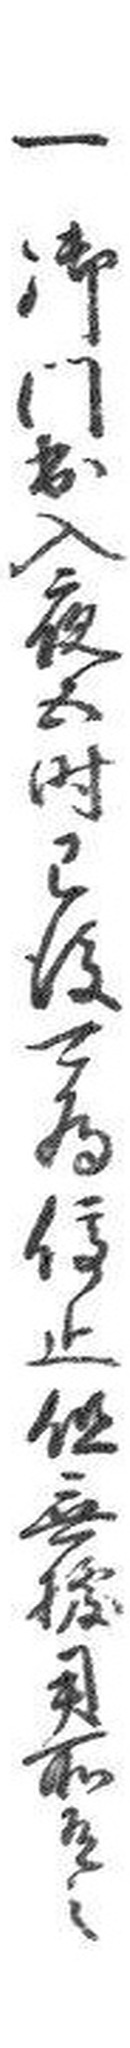一御門出入夜五時已後可為停止但無拠用所有之
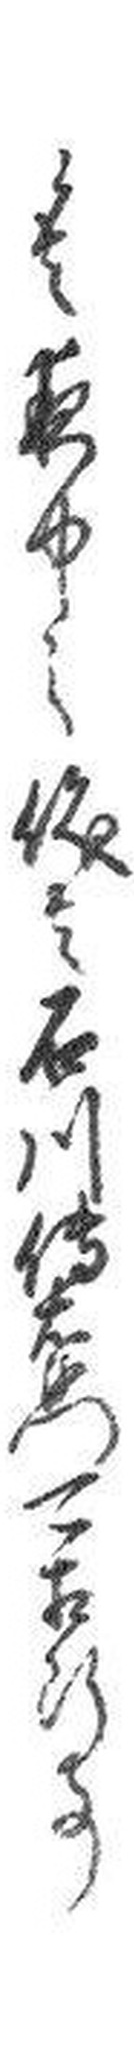候者夜中之儀者石川伝右衛門可相断事
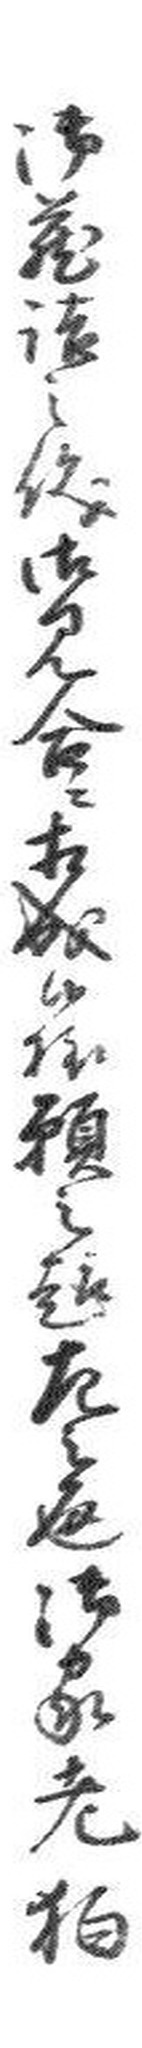御蔵詰之儀御見合ニ相成候様願之趣左之趣御家老狛
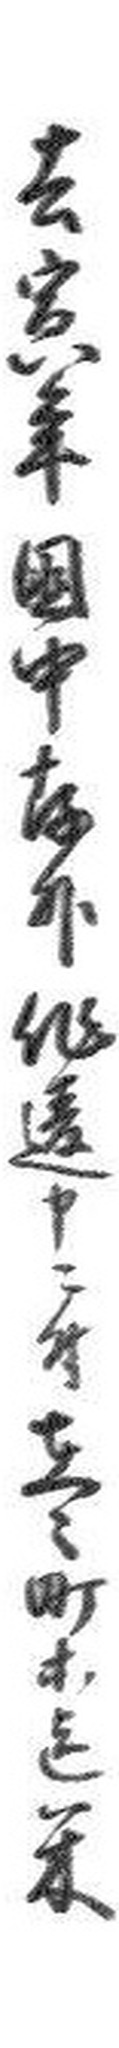去寅年国中存外作違申ニ付在々町迄米
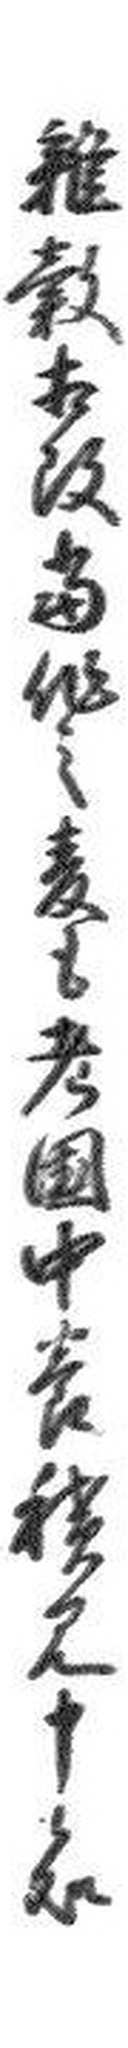雑穀相改当作之麦も考国中養積見申候処
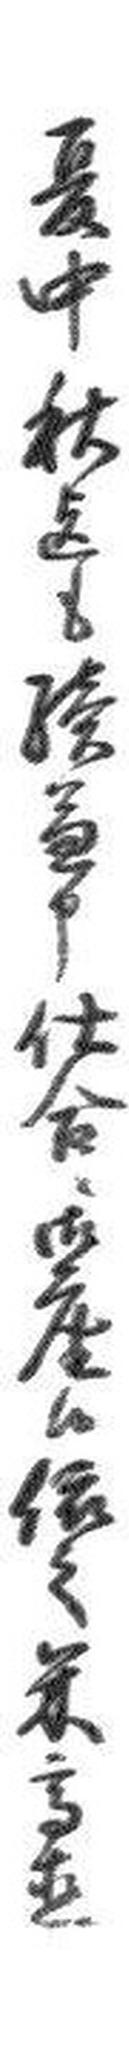夏中秋迄も続兼申仕合ニ御座候依之米高直
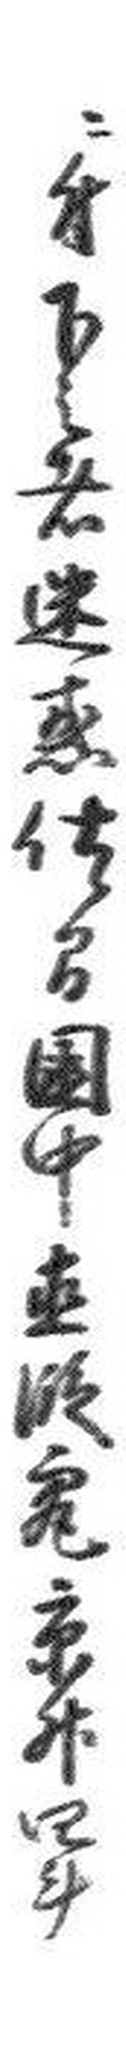ニ付下之者迷惑仕候間国中直段究京升四斗
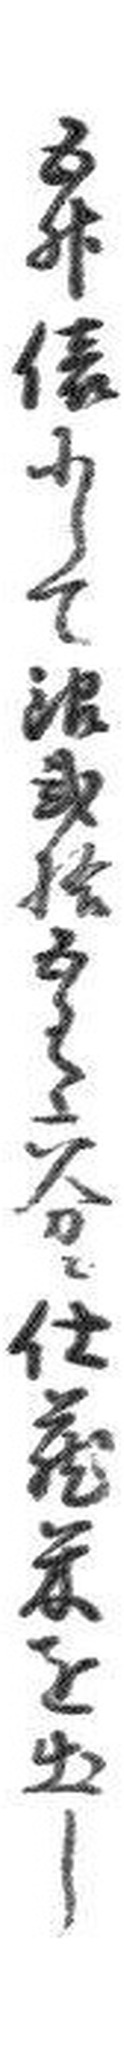五升俵にして銀弐拾五匁六分ニ仕蔵米を出し
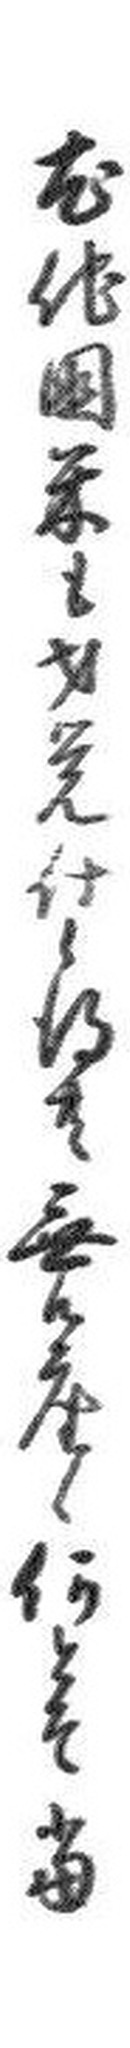尤他国米も才覚付候得共無御座候何とそ当
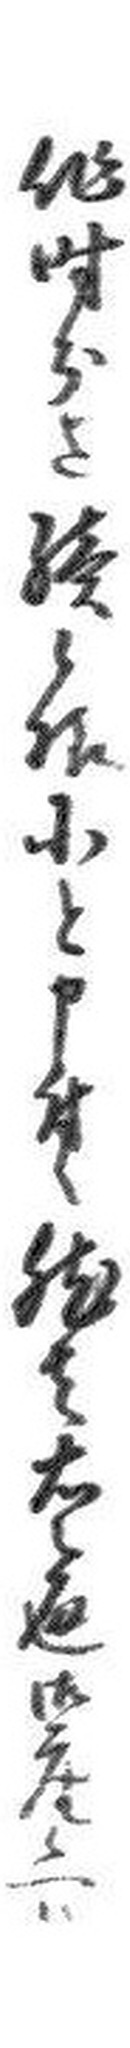作時分迄続候様にと申付候然者右之通御座候ヘハ
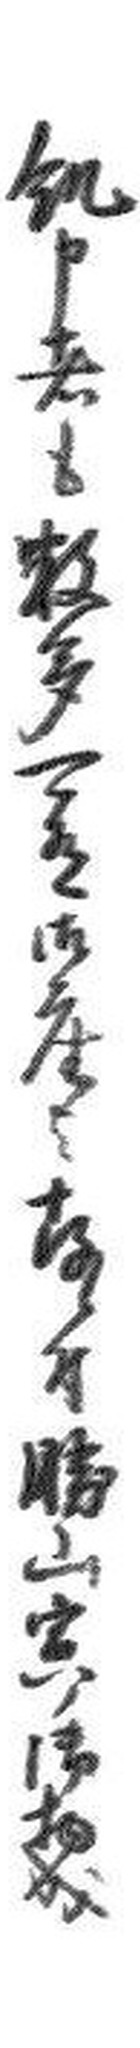飢申者も数多可有御座与存候付勝山寅ノ御物成
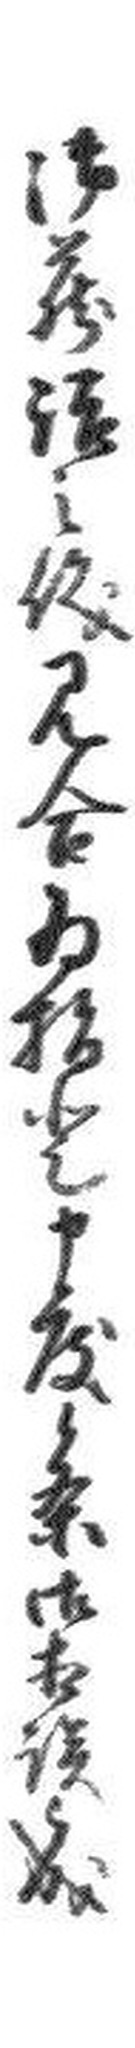御蔵詰之儀見合為指登申度候条御相談被成

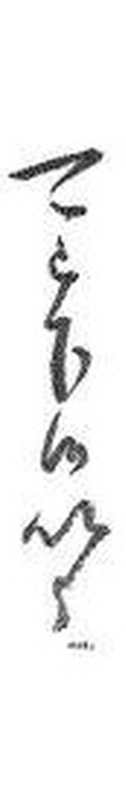可被下候以上
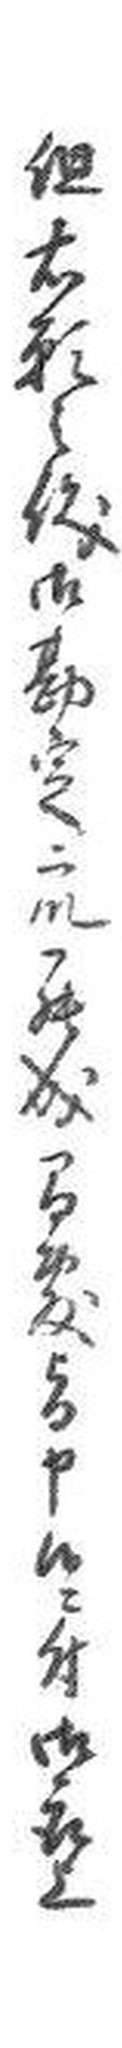但右願之儀御勘定衆罷成間敷旨申候ニ付御取上
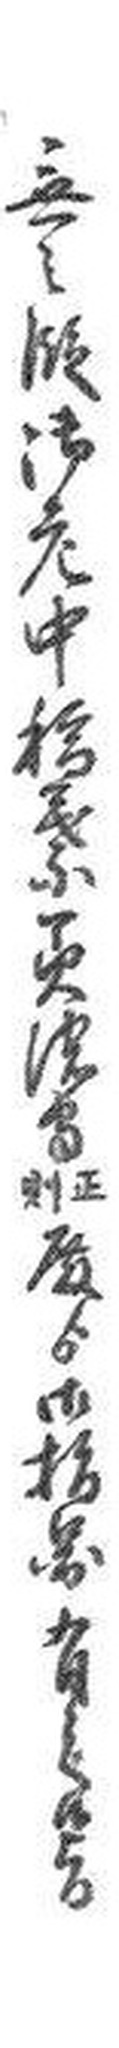無之段御老中稲葉美濃守正則殿ゟ御指図有之候旨
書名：家譜 十一 昌親公 従延宝二年到延宝四年八月
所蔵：福井県文書館 Fukui Prefectural Archives
